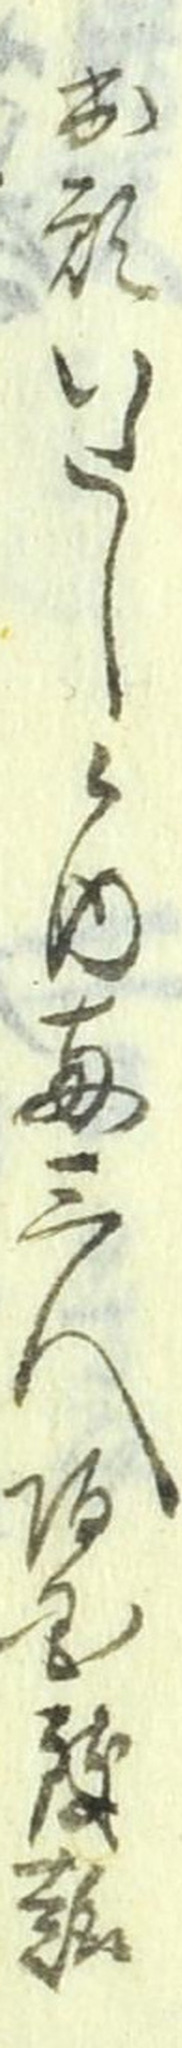出願いたし候内両三人帰国致趣
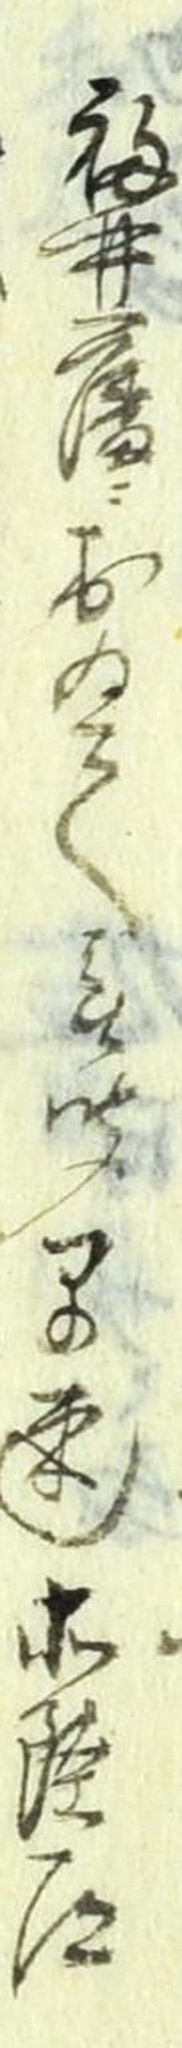福井藩ニおゐて被聞早速北陸道
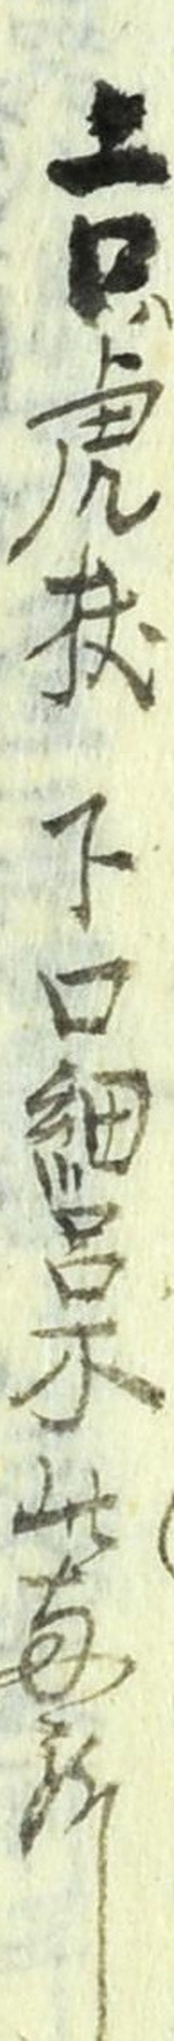上口ハ虎杖下口細呂木此両所
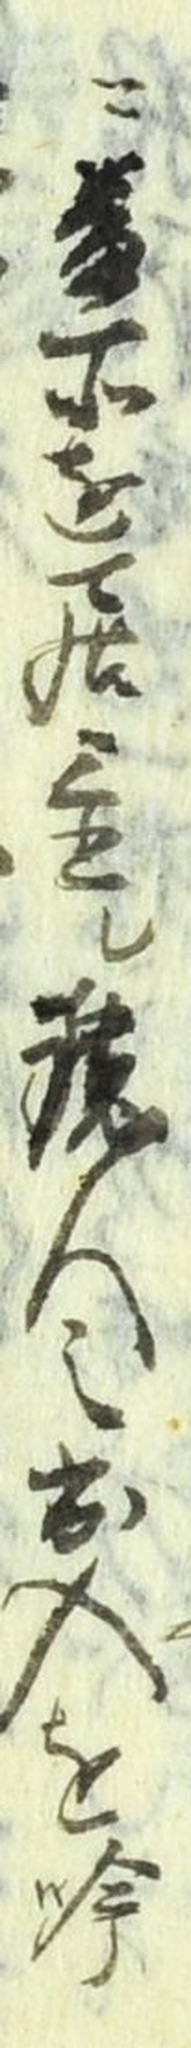ニ番所を居置レ諸人之出入を吟
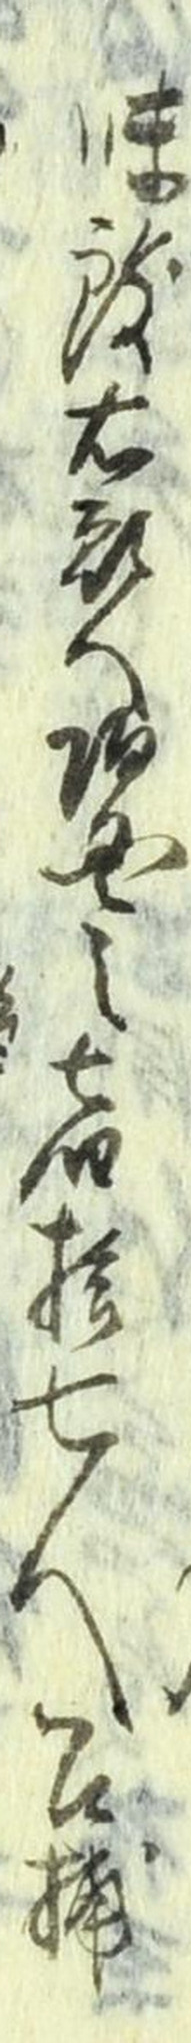味致右願人帰国之者拾七人召捕
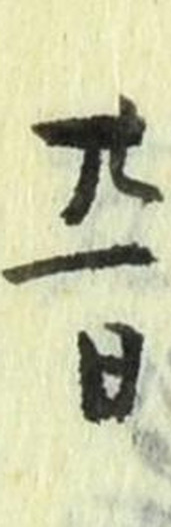廿六日
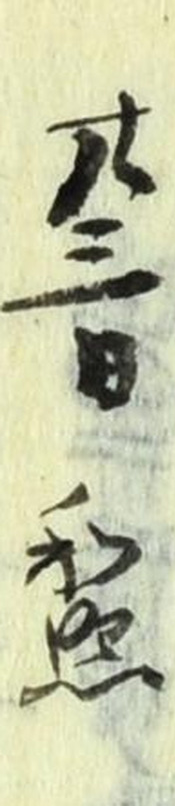三十日和照
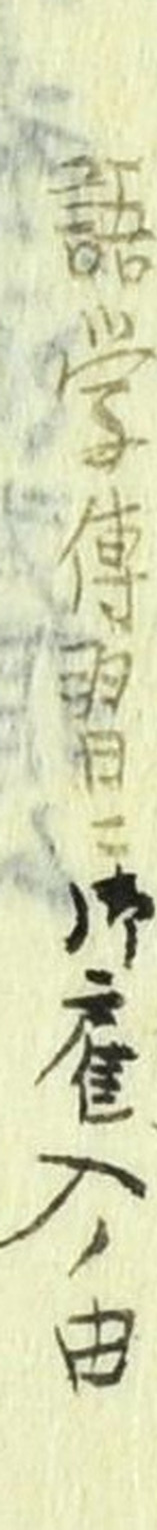語学伝習ニ御雇入ノ由
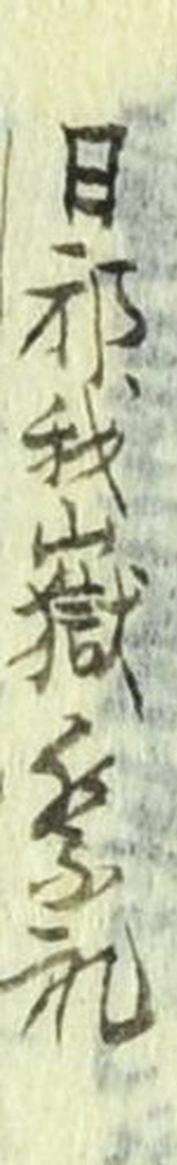日邪我嶽祭礼
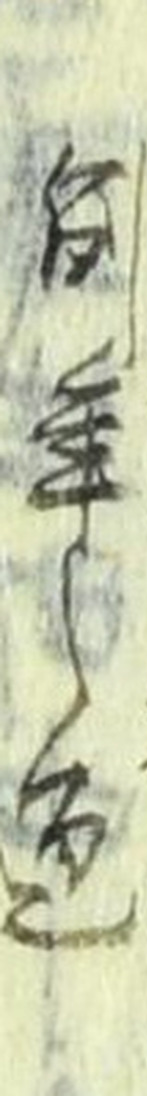例年之通
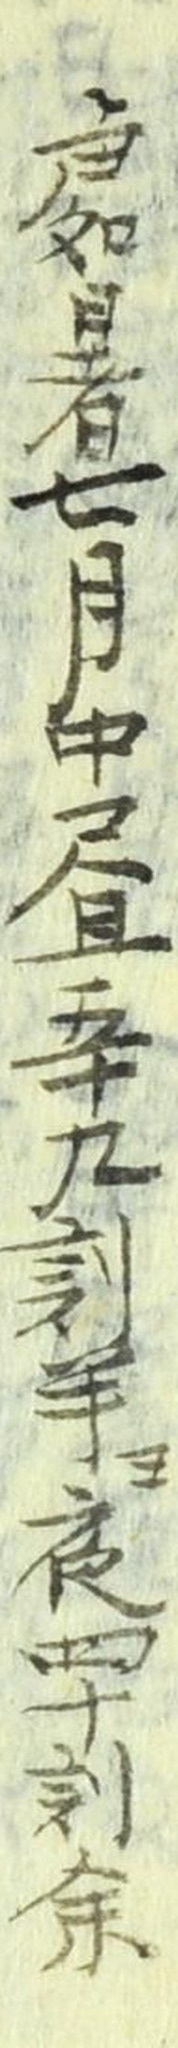処暑七月中昼五十九刻半ヨ夜四十刻余
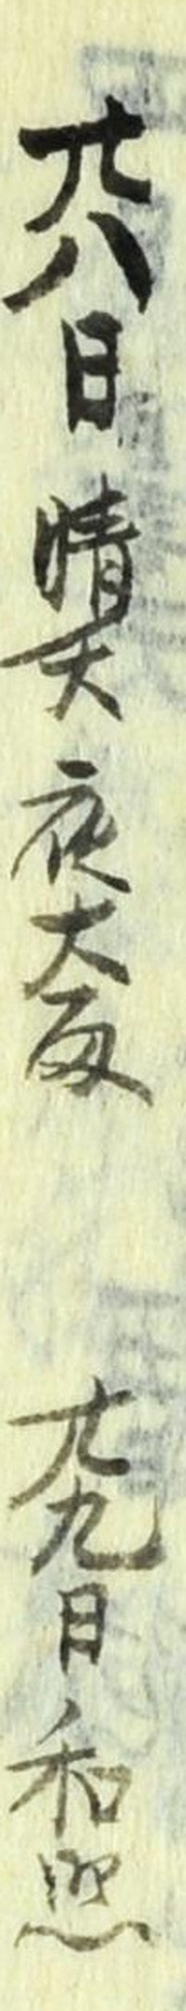廿八日晴天夜大雨廿九日和照
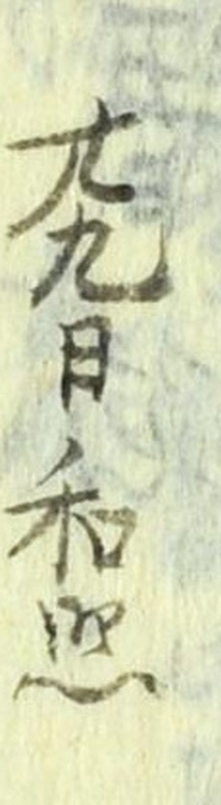三十日和照
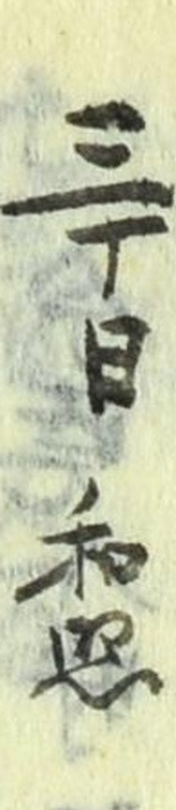三十日和照
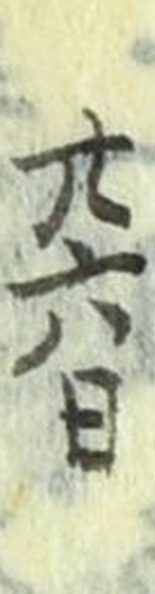廿六日
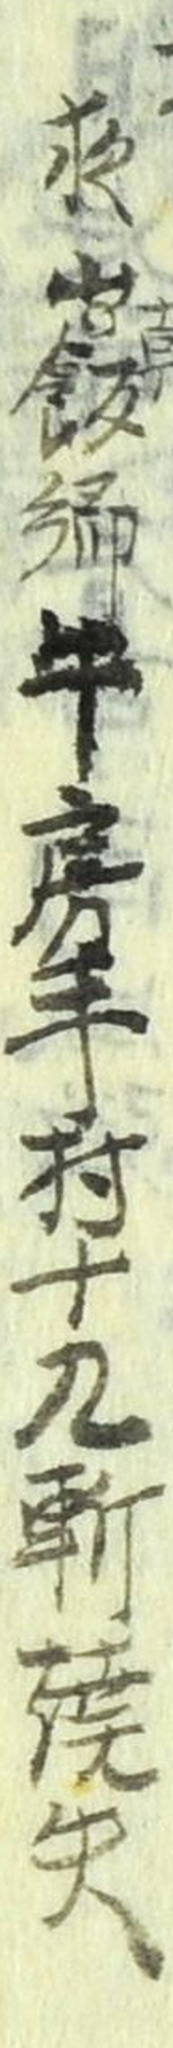夜山幹飯郷牛房平村十九軒焼失
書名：（日記）
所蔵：福井県文書館 Fukui Prefectural Archives
